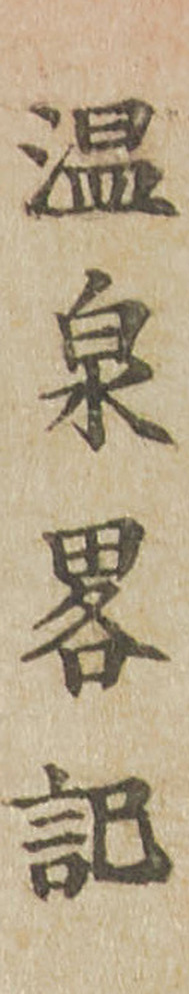温泉略記
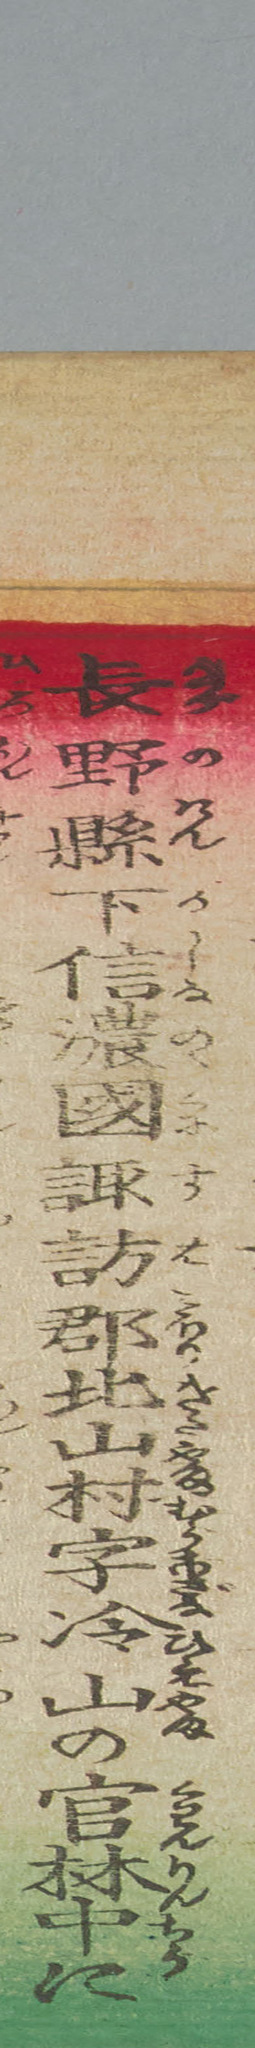長野縣下信濃國諏訪郡北山村字冷山の官林中に
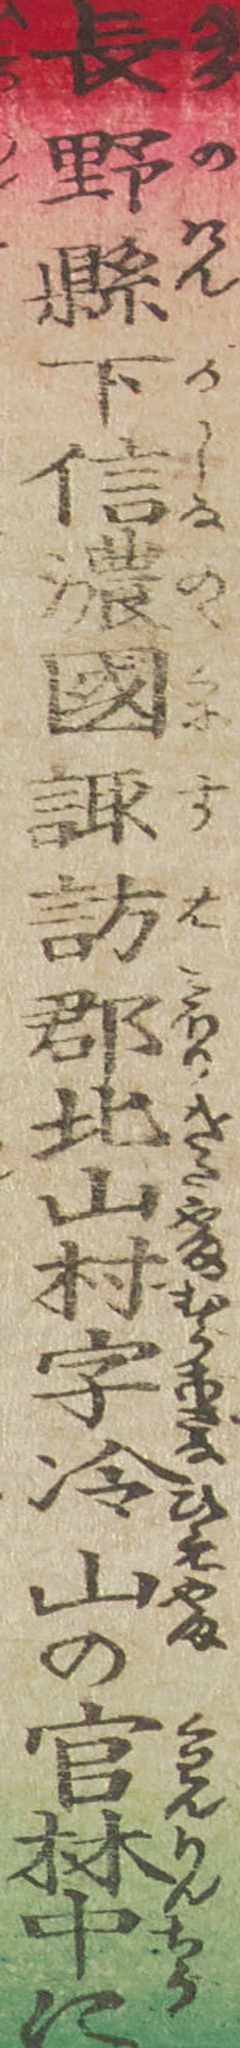長野縣下信濃國諏訪郡北山村字冷山の官林中に
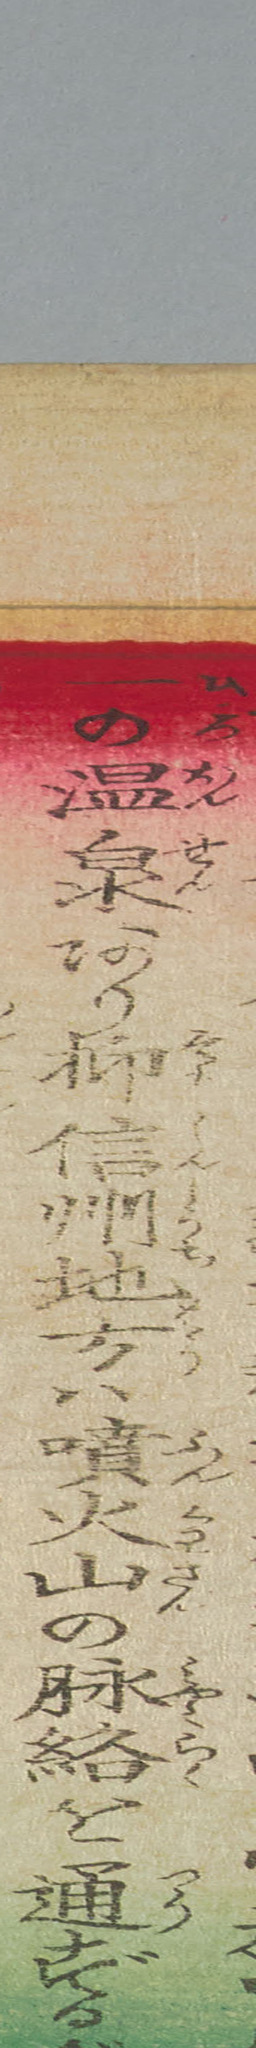一の温泉あり抑信州地方ハ噴火山の脉絡を通ずるが
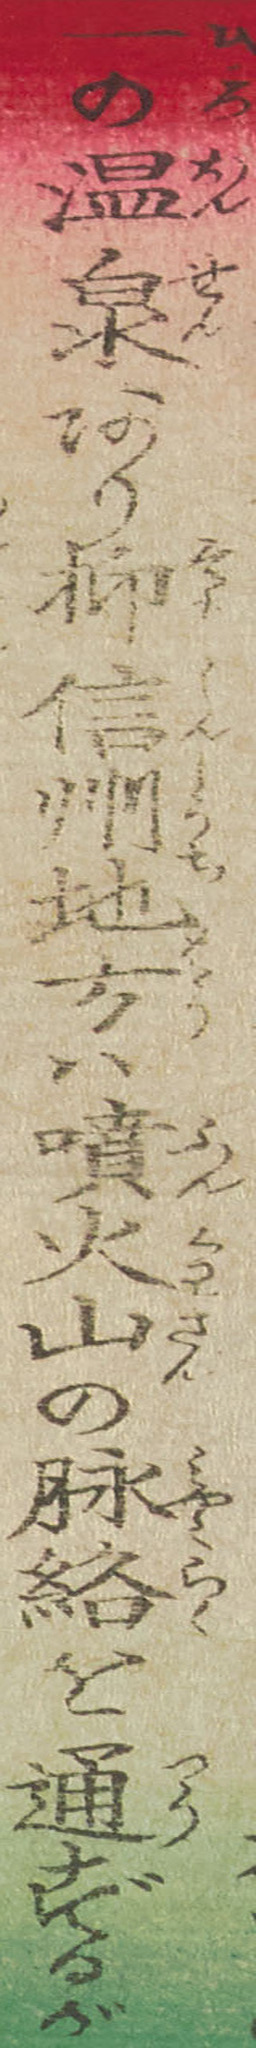一の温泉あり抑信州地方ハ噴火山の脉絡を通ずるが
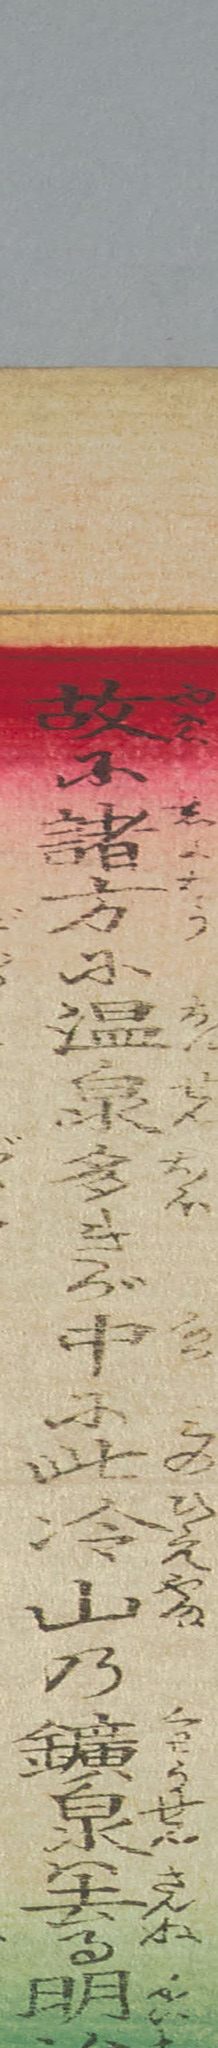故に諸方に温泉多きが中に此冷山の鑛泉ハ去る明治
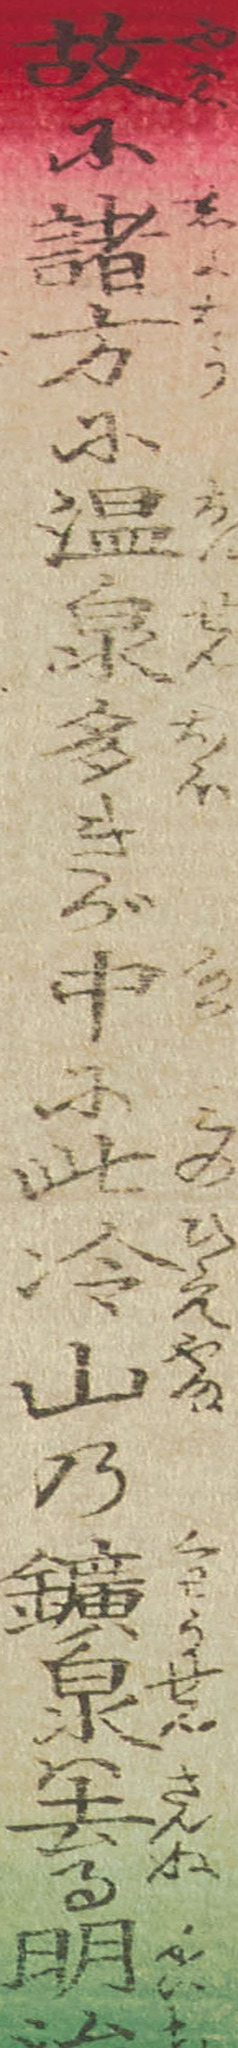故に諸方に温泉多きが中に此冷山の鑛泉ハ去る明治
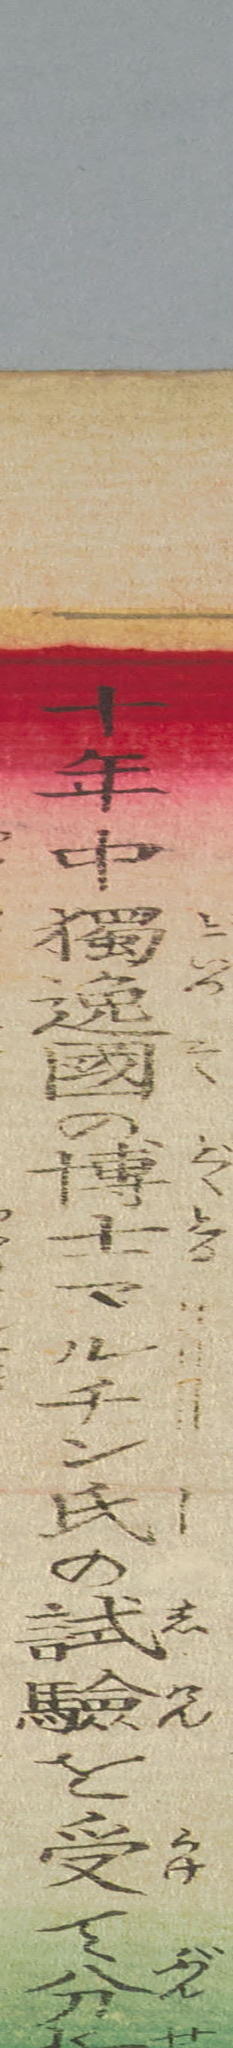十年中獨逸國の博士マルチン氏の試驗を受て分析
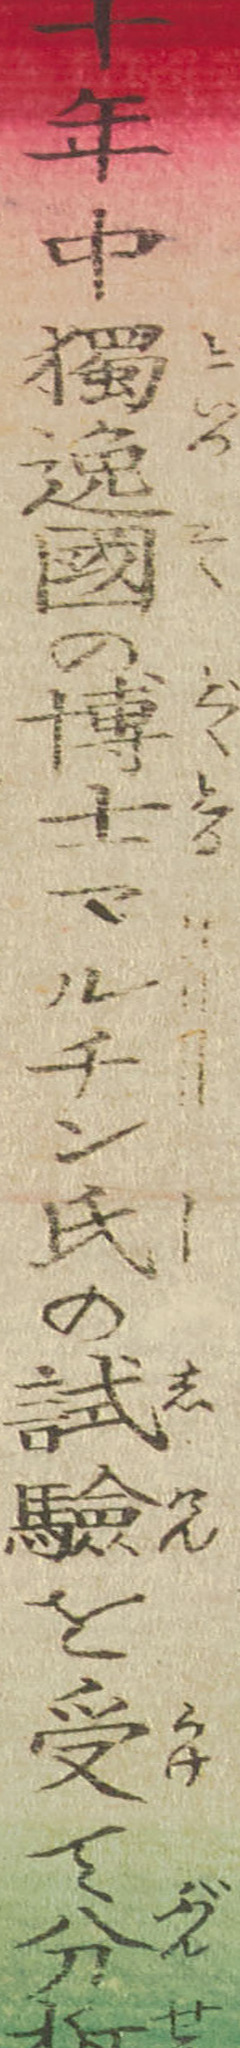十年中獨逸國の博士マルチン氏の試驗を受て分析
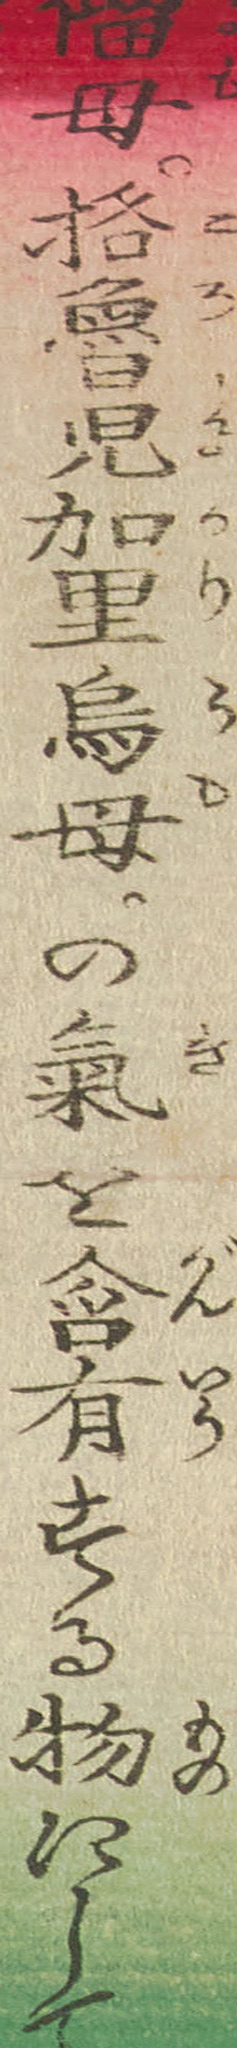母。挌魯児加里烏母。の氣を含有する物にして
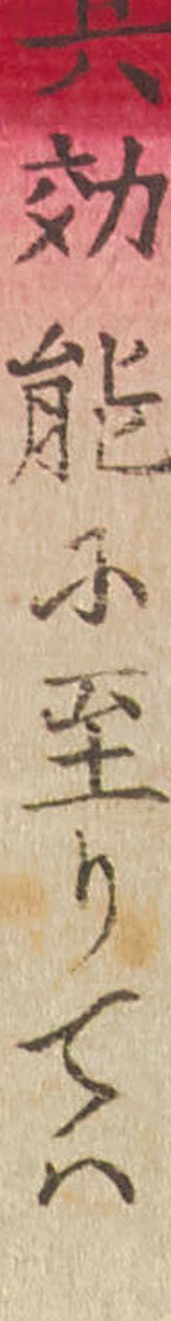其効能に至りてハ
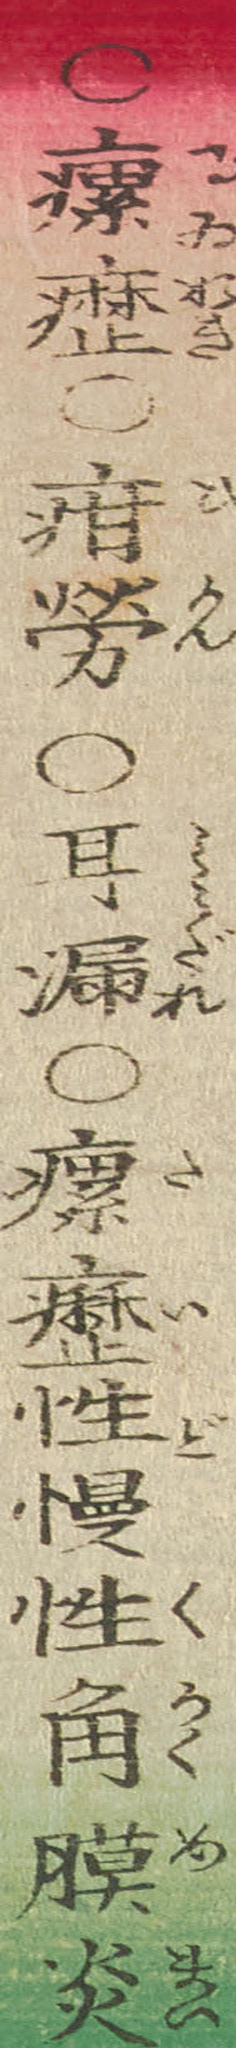◯瘰癧◯疳勞◯耳漏◯瘰癧性慢性角膜炎
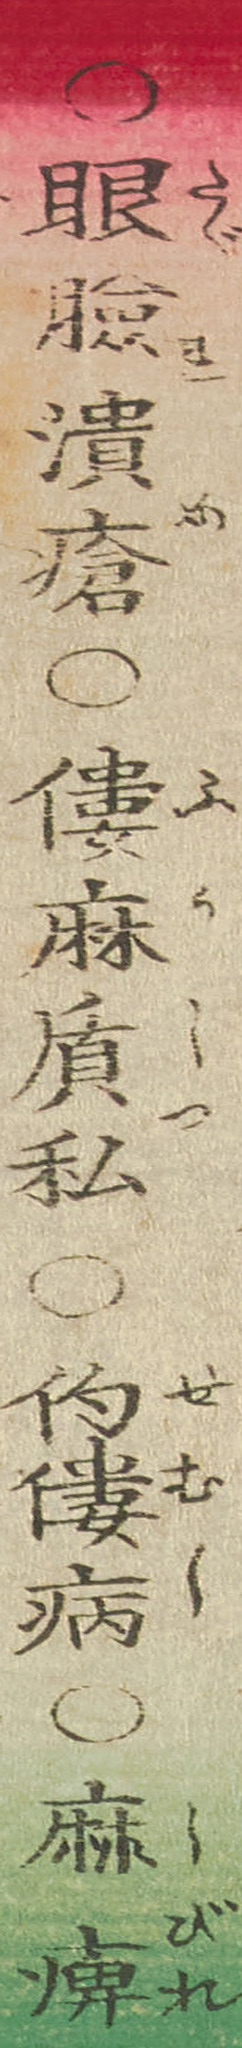◯眼瞼潰瘡◯僂麻質私◯佝僂病◯麻痺
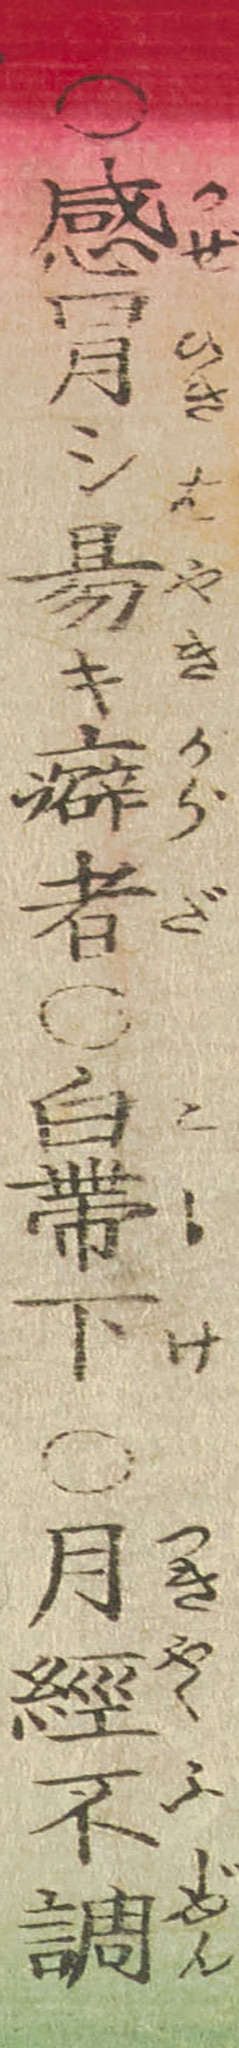◯感冒シ易キ癖者◯白帯下◯月經不調
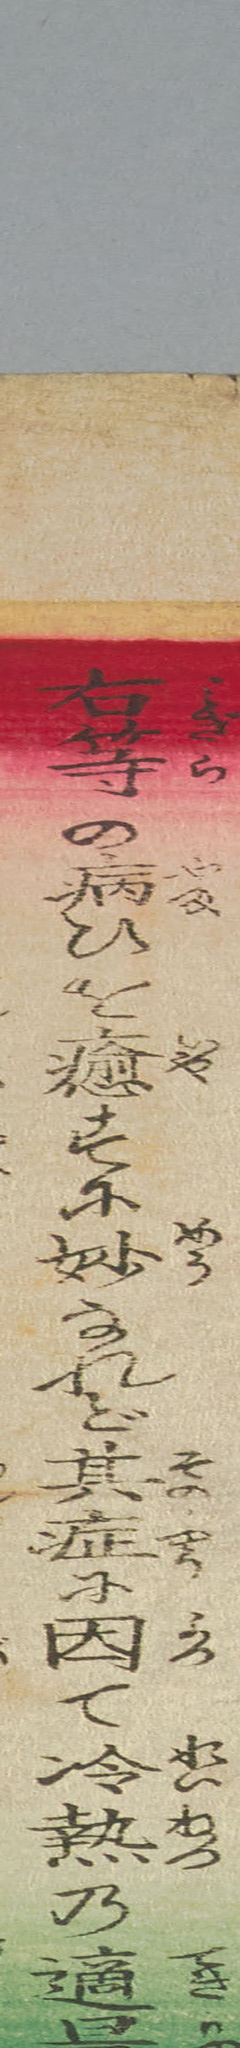右等の病ひを癒すに妙なれど其症に因て冷熱の適量
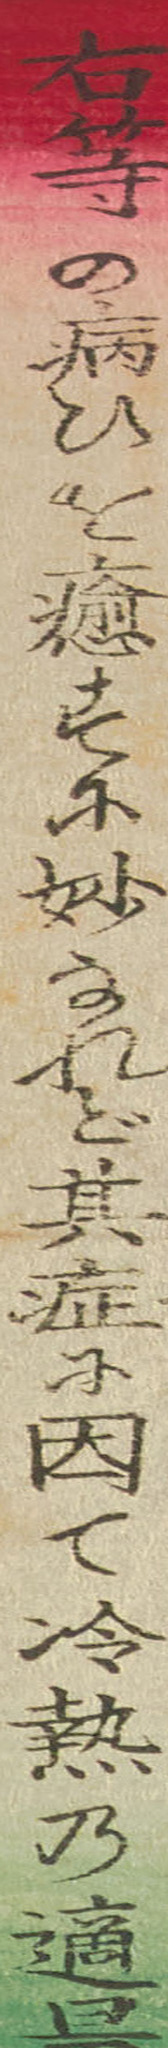右等の病ひを癒すに妙なれど其症に因て冷熱の適量
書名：温泉略記
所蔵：東京大学総合図書館 General Library in the University of Tokyo, JAPAN
